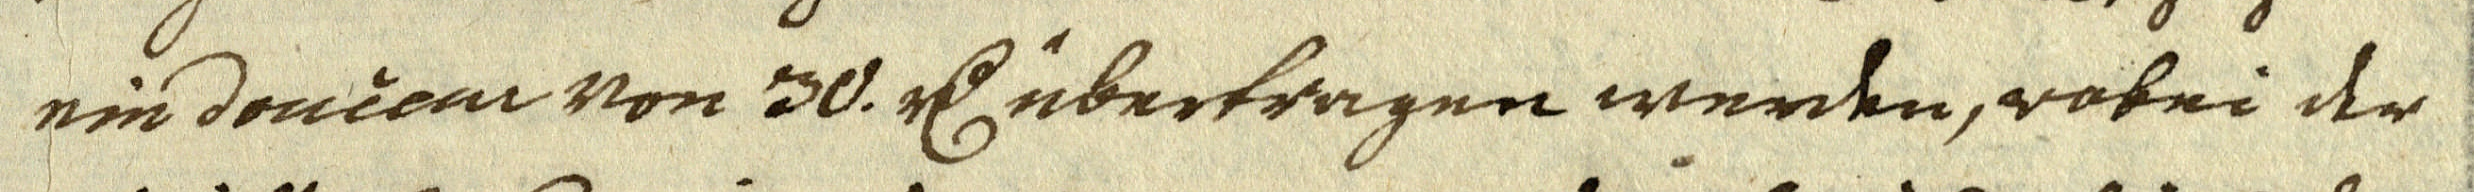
ein douceur von 30. r. übertragen werden, wobei der
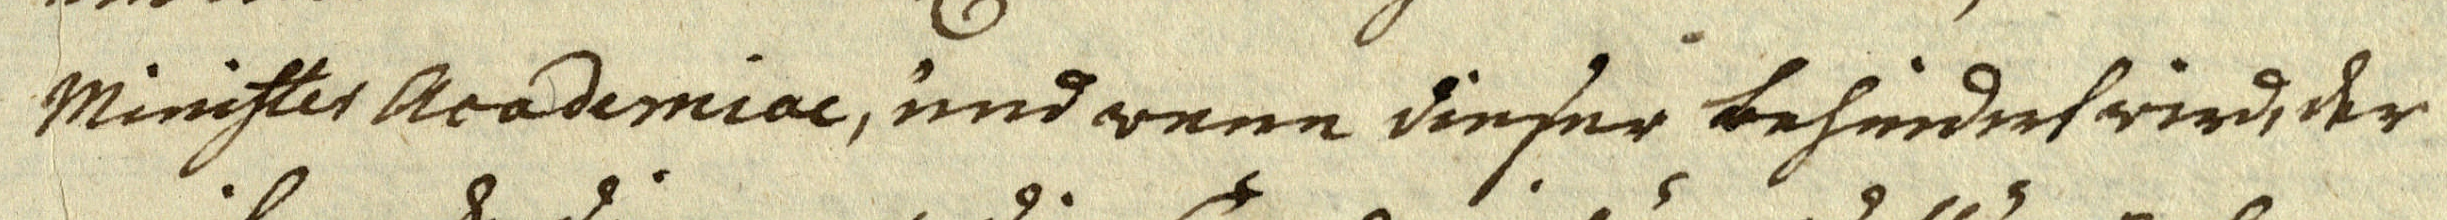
Minister Academiae, und wenn dieser behindert wird, der
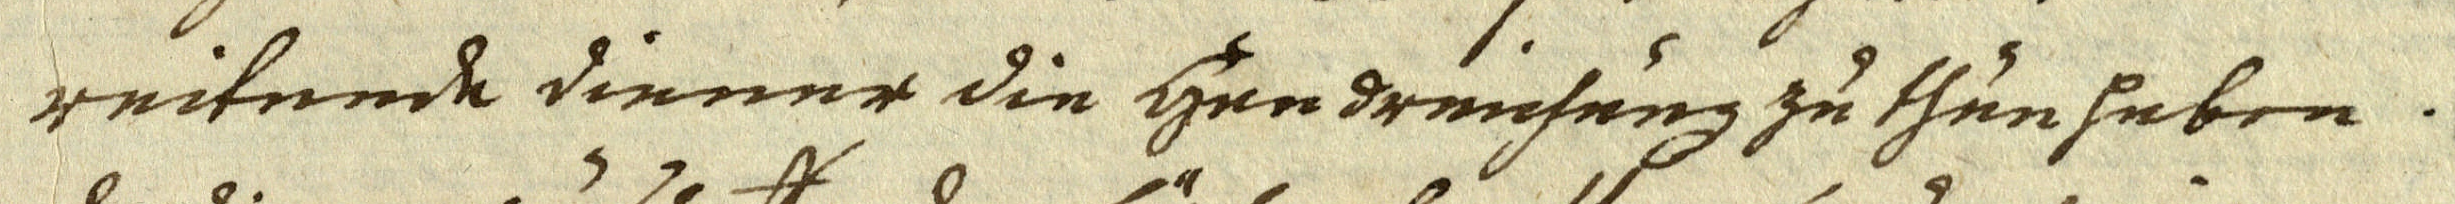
reitende Diener die Handreichung zu thun haben.
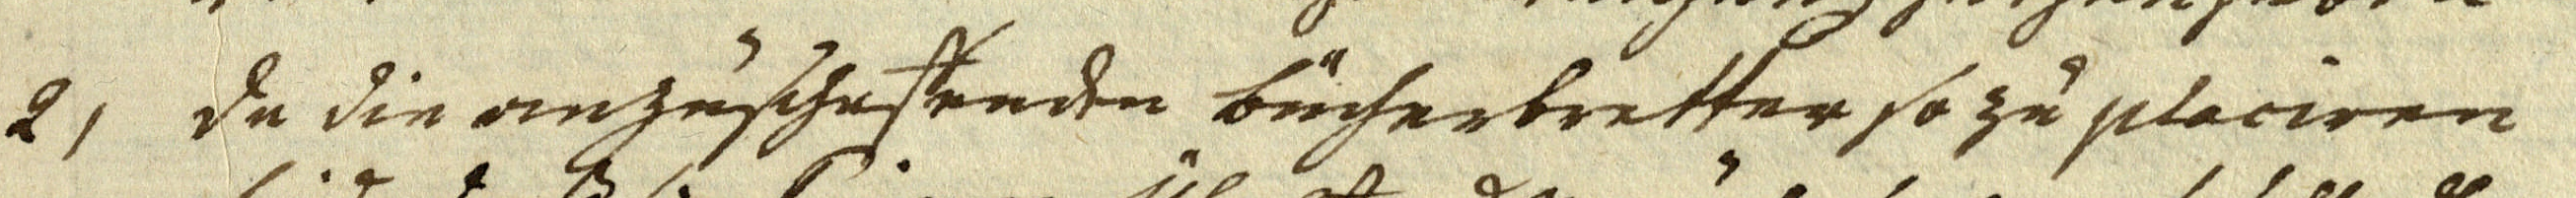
2, da die anzuschaffenden Bücherbretter so zu placiren
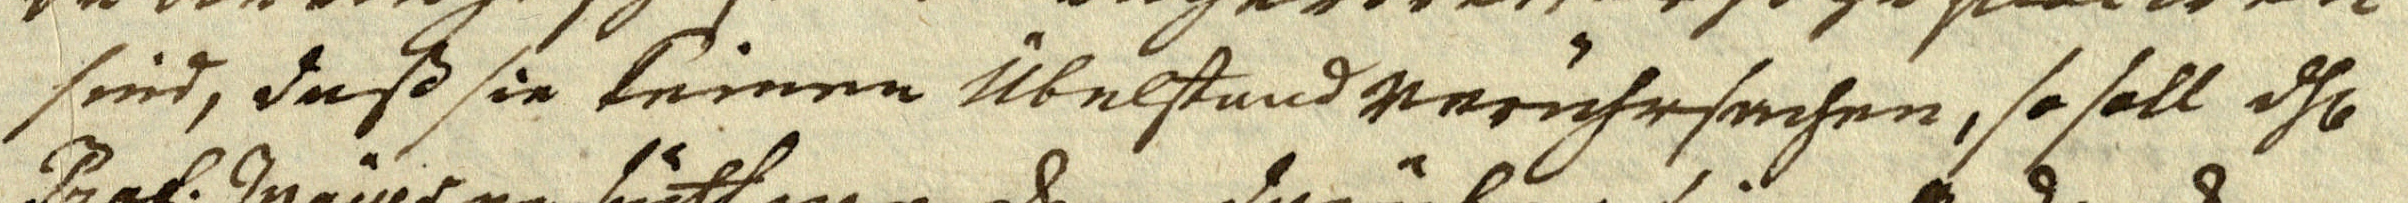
sind, daß sie keinen Übelstand veruhrsachen, so soll dh
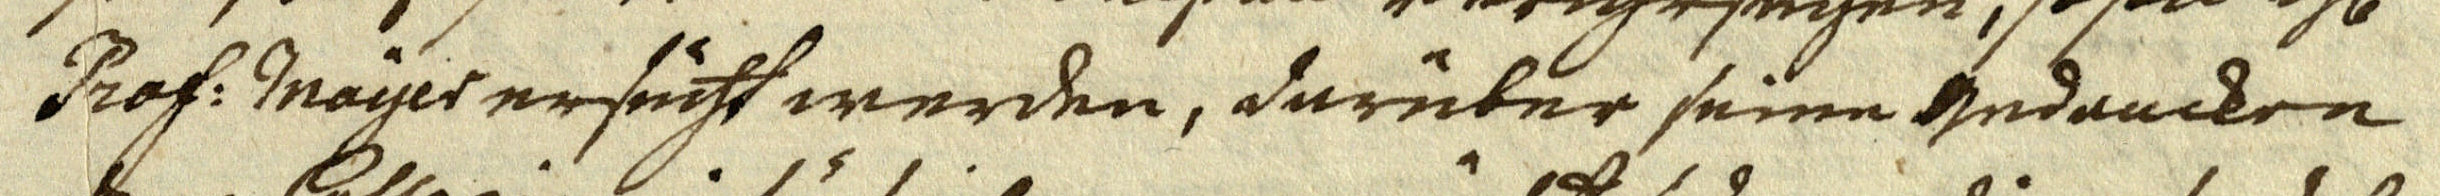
Prof. Maÿer ersucht werden, darüber seine Gedanken
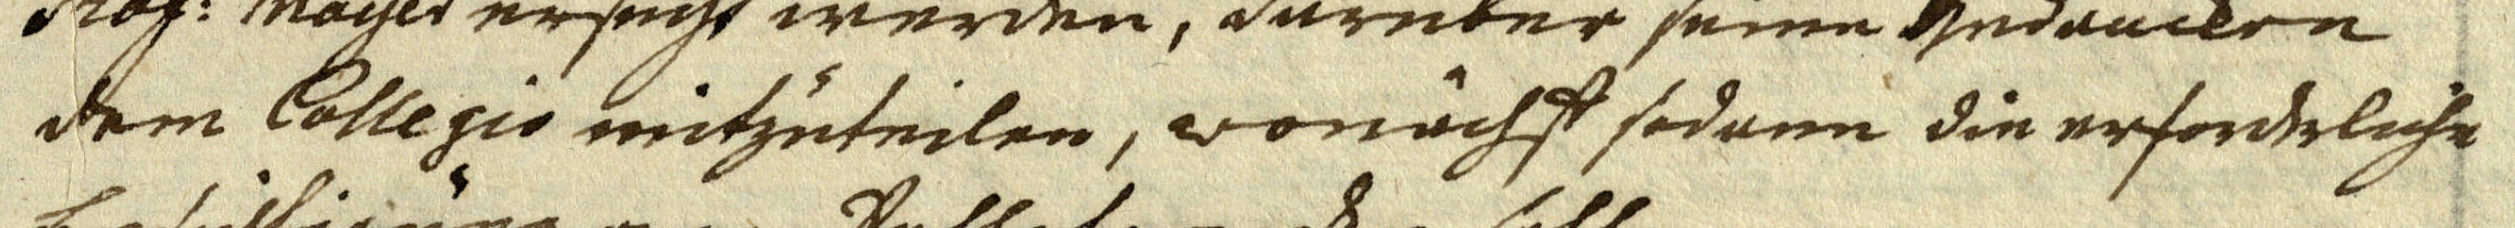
dem Collegio mitzuteilen, wonächst sodann die erforderliche
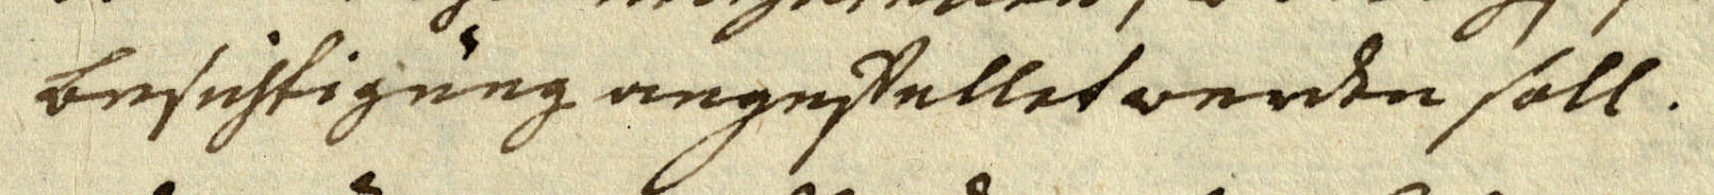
Besichtigung angestellet werden soll.
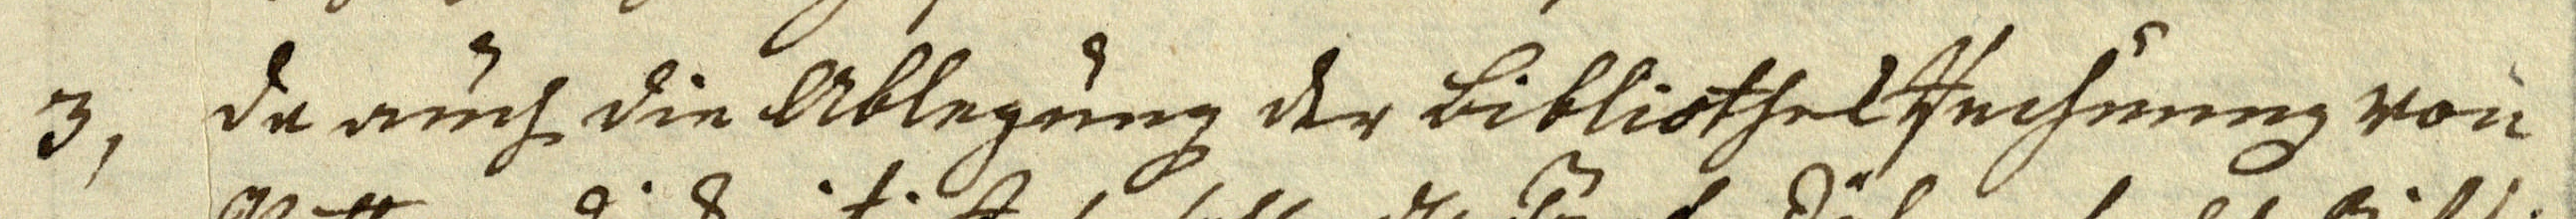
3, da auch die Ablegung der BibliothekRechnung von
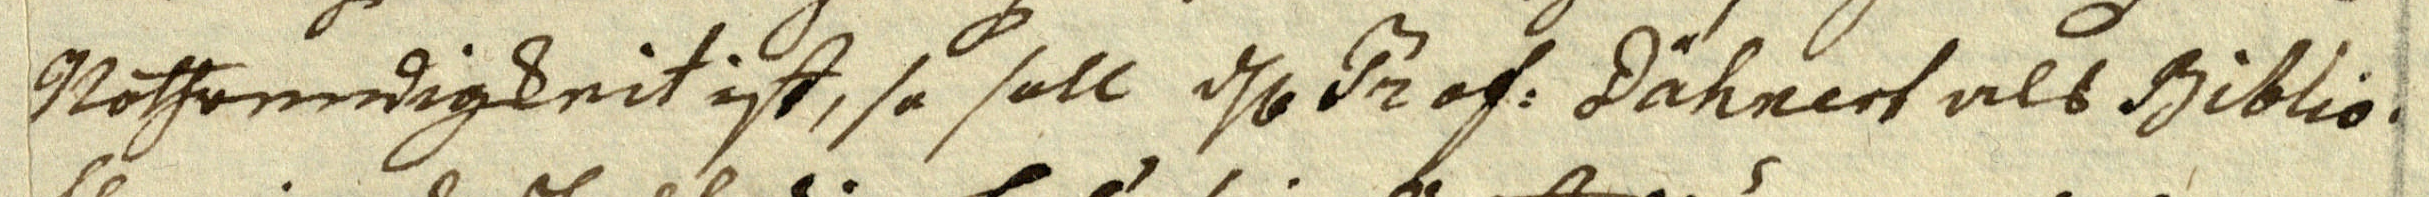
Nothwendigkeit ist, so soll dh Prof. Dähnert als Biblio¬
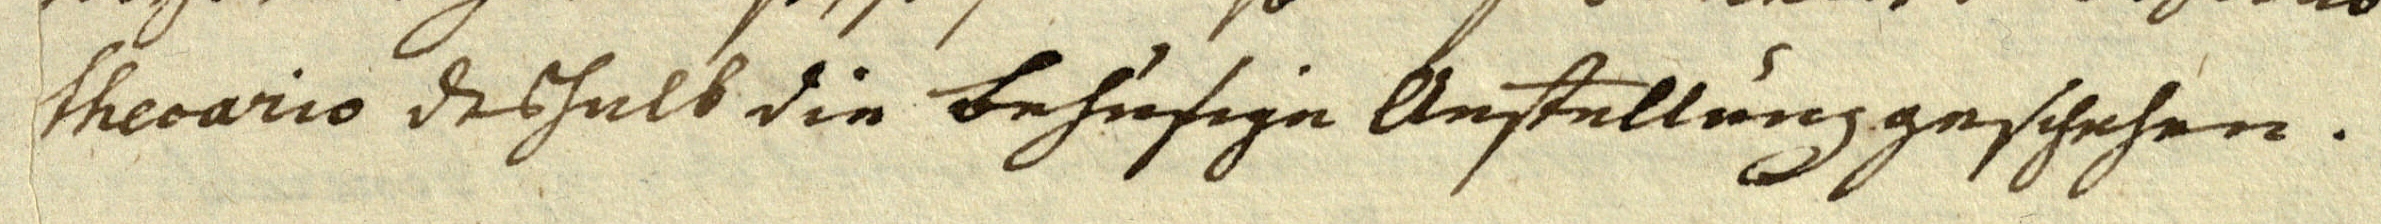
thecario deshalb die behufige Anstellung geschehen.
